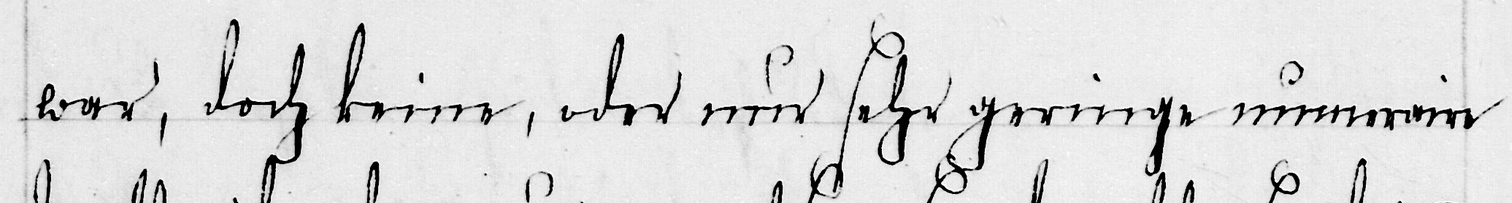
war, doch keine, oder nur sehr geringe numeraire
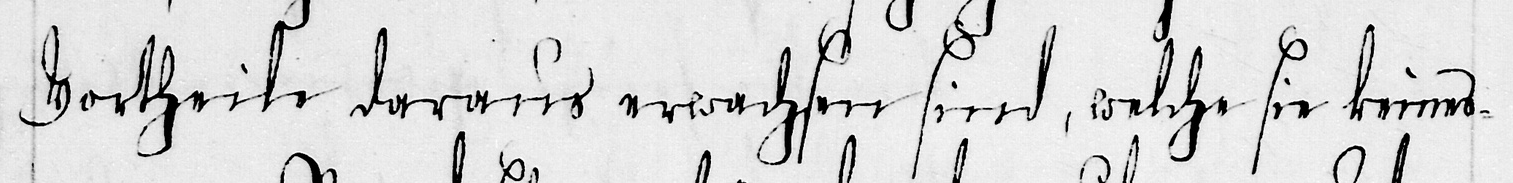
Vortheile daraus erwachsen sind, welche sie keines¬
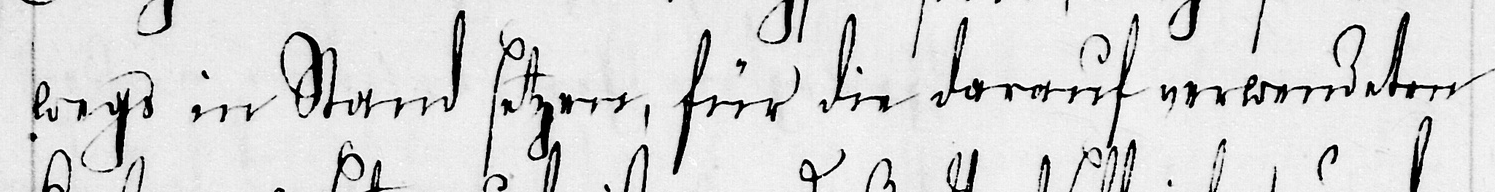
wegs in Stand setzen, für die darauf verwendeten
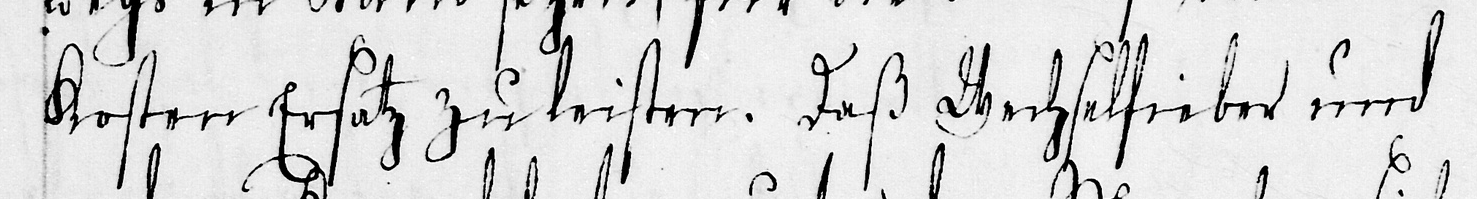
Kosten Ersatz zu leisten. Daß Wechselfieber und
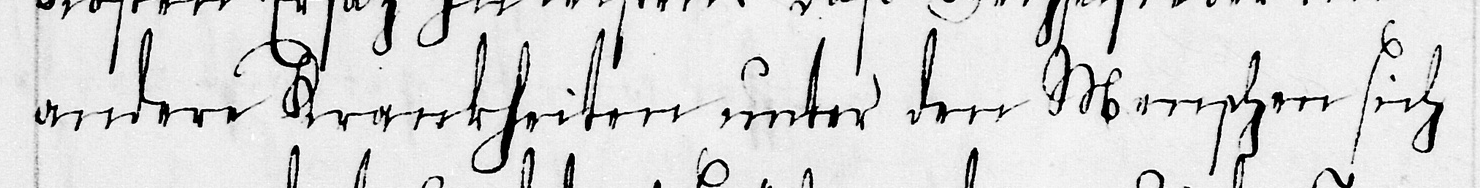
andere Krankheiten unter den Menschen sich
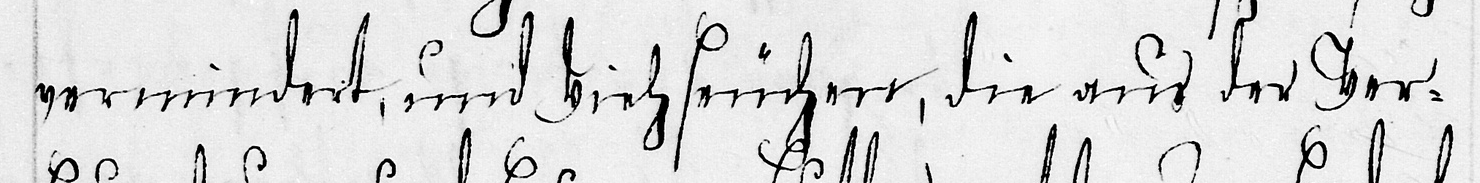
vermindert, und Viehseuchen, die aus der Ver¬
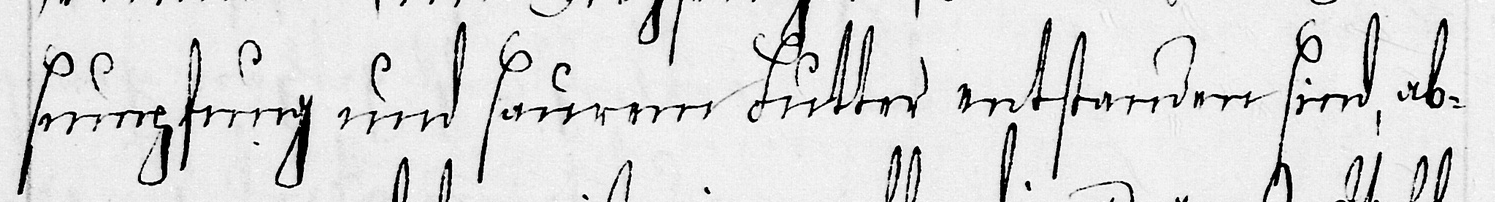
sumpfung und saurem Futter entstanden sind, ab¬
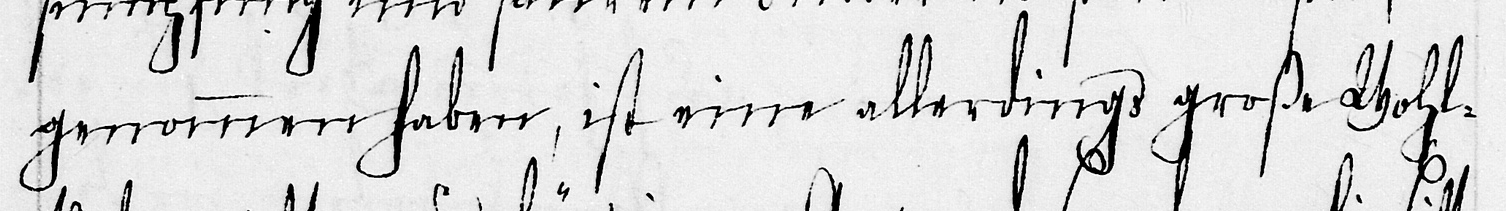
genommen haben, ist eine allerdings große Wohl¬
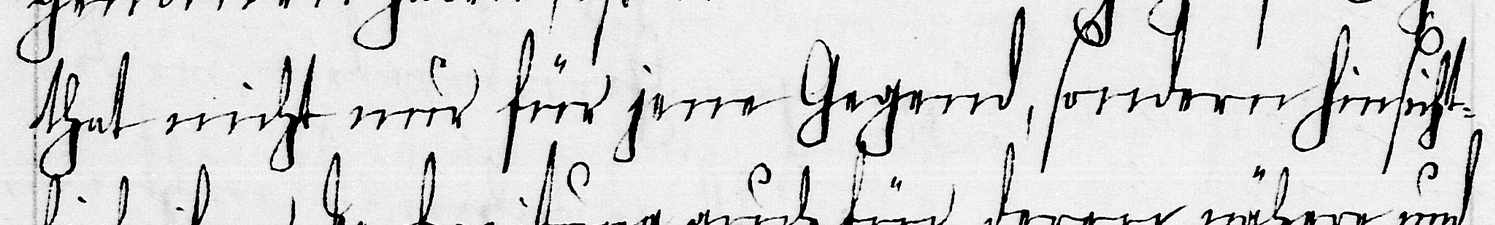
that nicht nur für jene Gegend, sondern hinsich¬
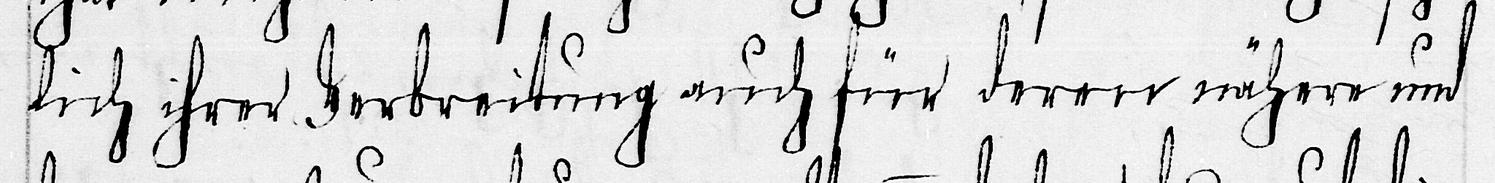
tlich ihrer Verbreitung auch für deren nähere und
